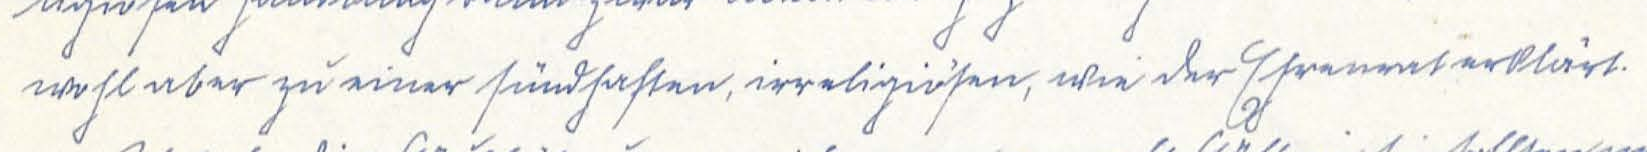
wohl aber zu einer sündhaften, irreligiösen, wie der Ehrenrat erklärt.
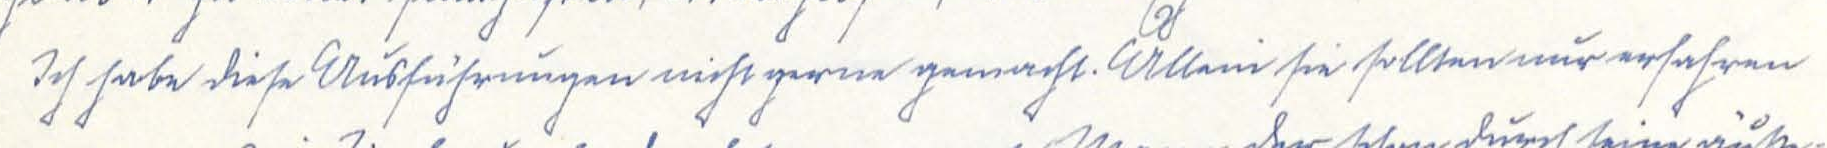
Ich habe diese Ausführungen nicht gerne gemacht. Allein sie sollten nur erfahren
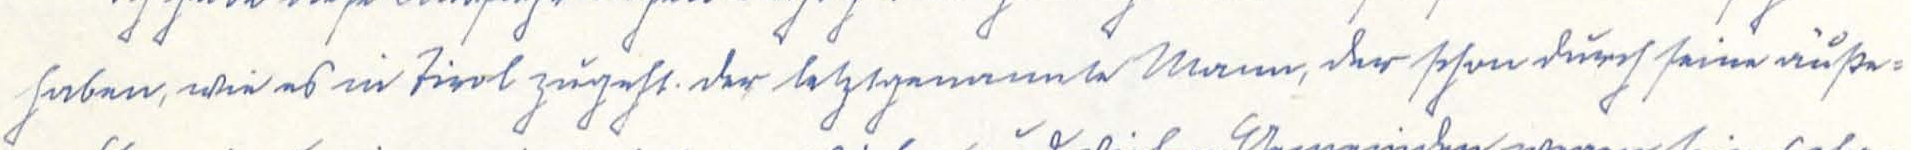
haben, wie es in Tirol zugeht. Der letztgenannte Mann, der schon durch seine äuße-
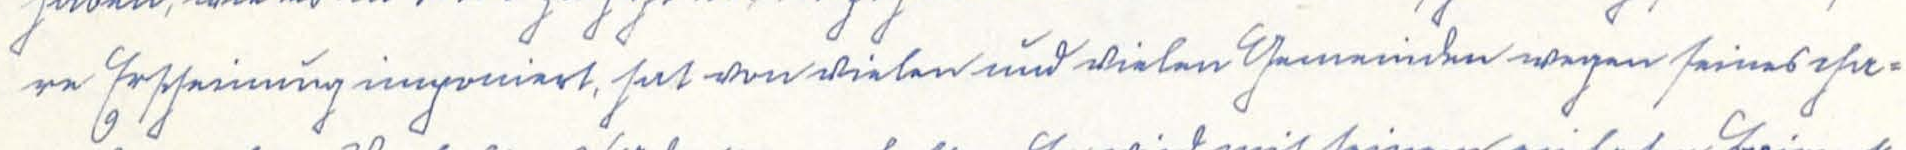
re Erscheinung innponiert, hat von vielen und vielen Gemeinden wegen seines cha-
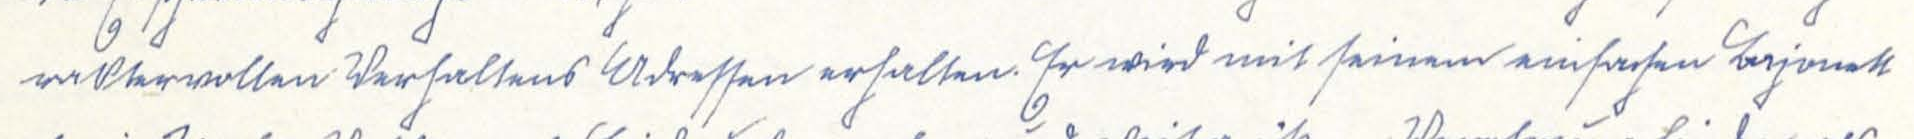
raktervollen Verhaltens Adressen erhalten. Er wird mit seinem einfachen Bajonett
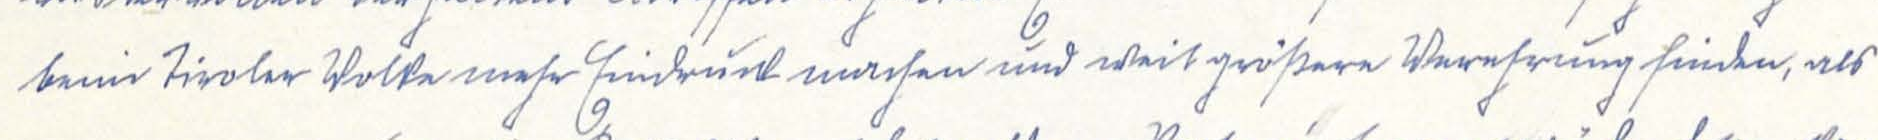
beim Tiroler Volke mehr Eindruck machen und weit größere Verehrung finden, als
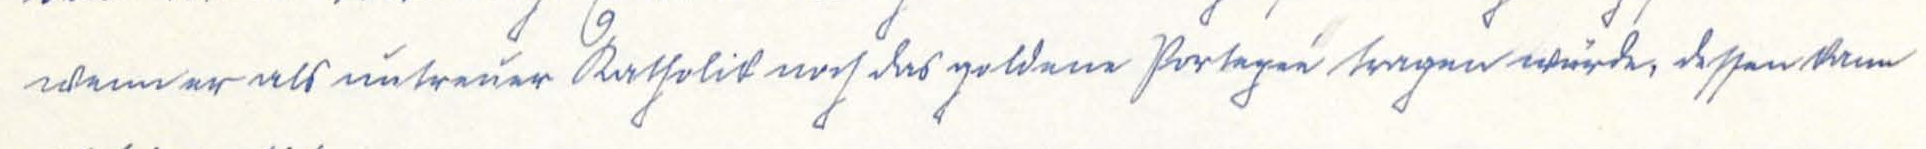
wenn er als untreuer Ratholik noch das goldene Portepée tragen würde, dessen kann
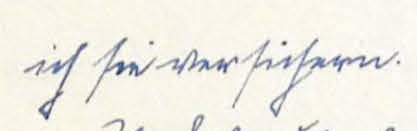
ich sie versichern.
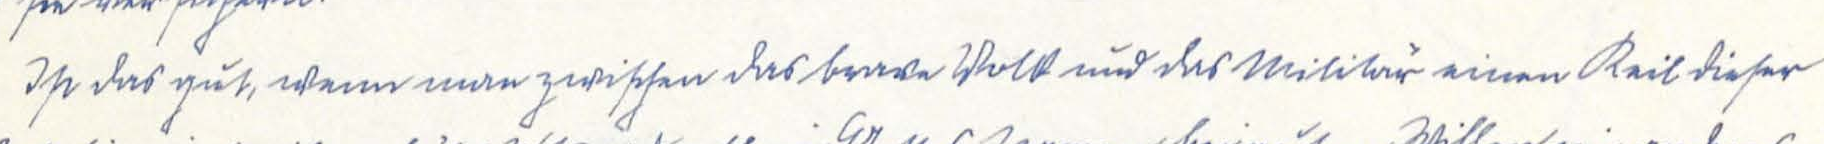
Ist das gut, wenn man zwischen das brave Volk und das Militär einen Keil dieser
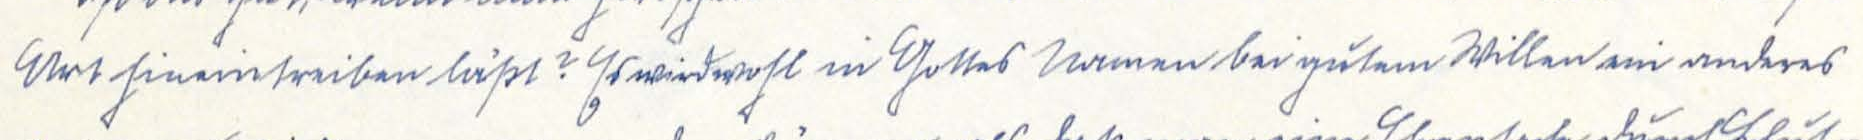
Art hineintreiben läßt? Es wird wohl in Gottes Namen bei gutem Willen ein anderes
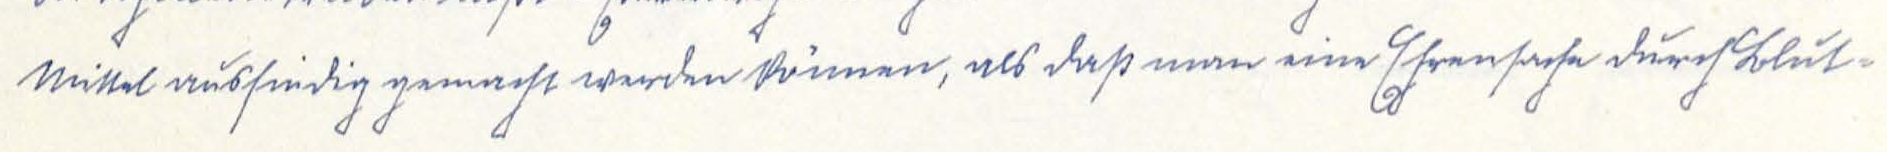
Mittel ausfindig gemacht werden können, als daß man eine Ehrensache durch Blut-
